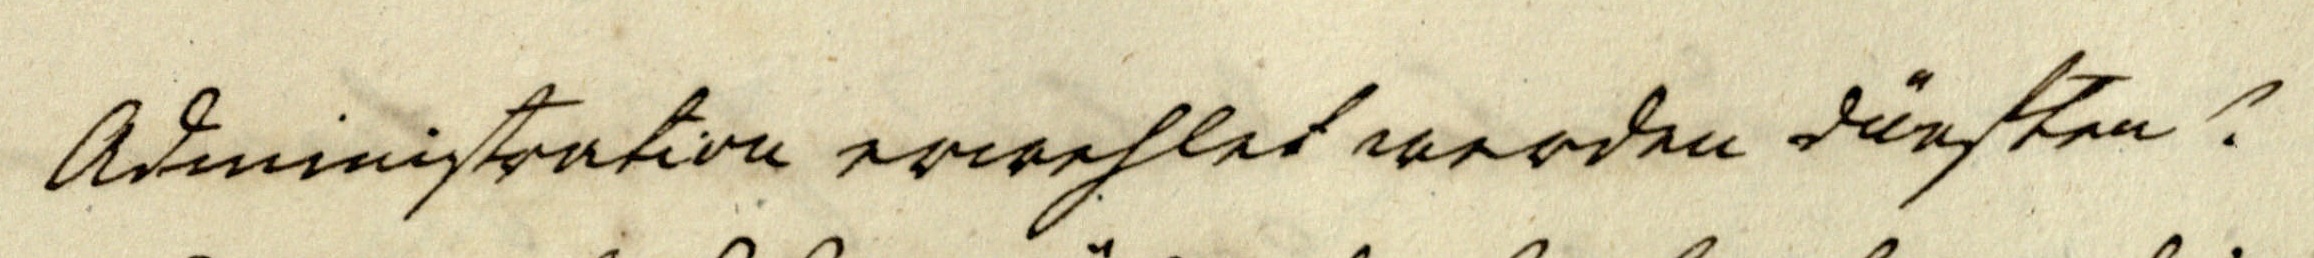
Administration erwehlet werden dürften ?
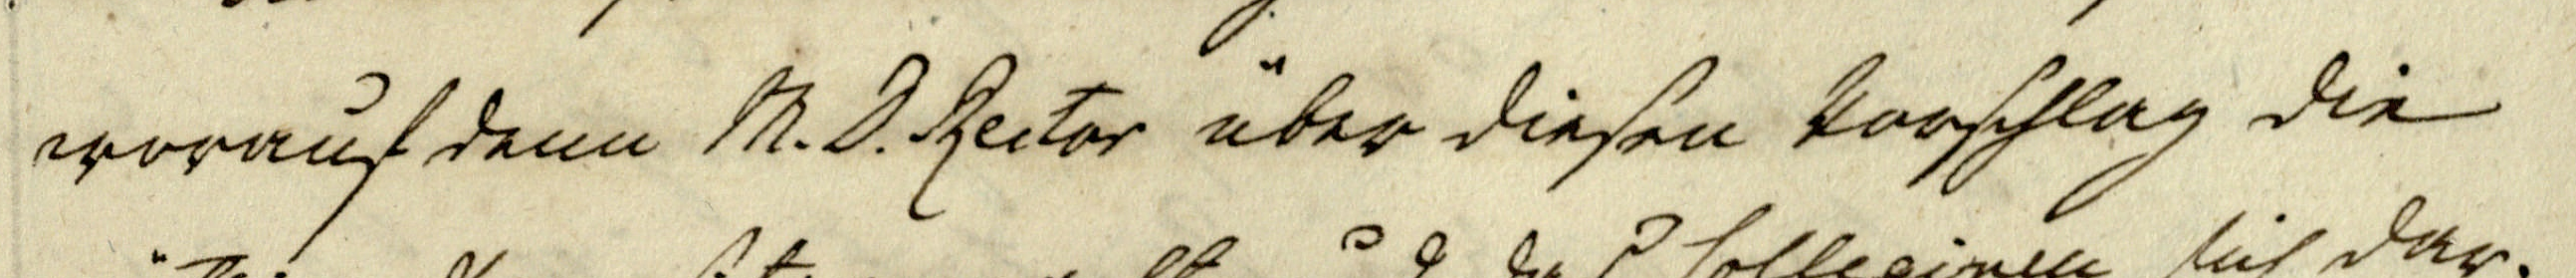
worauf denn M. D. Rector über diesen Vorschlag die
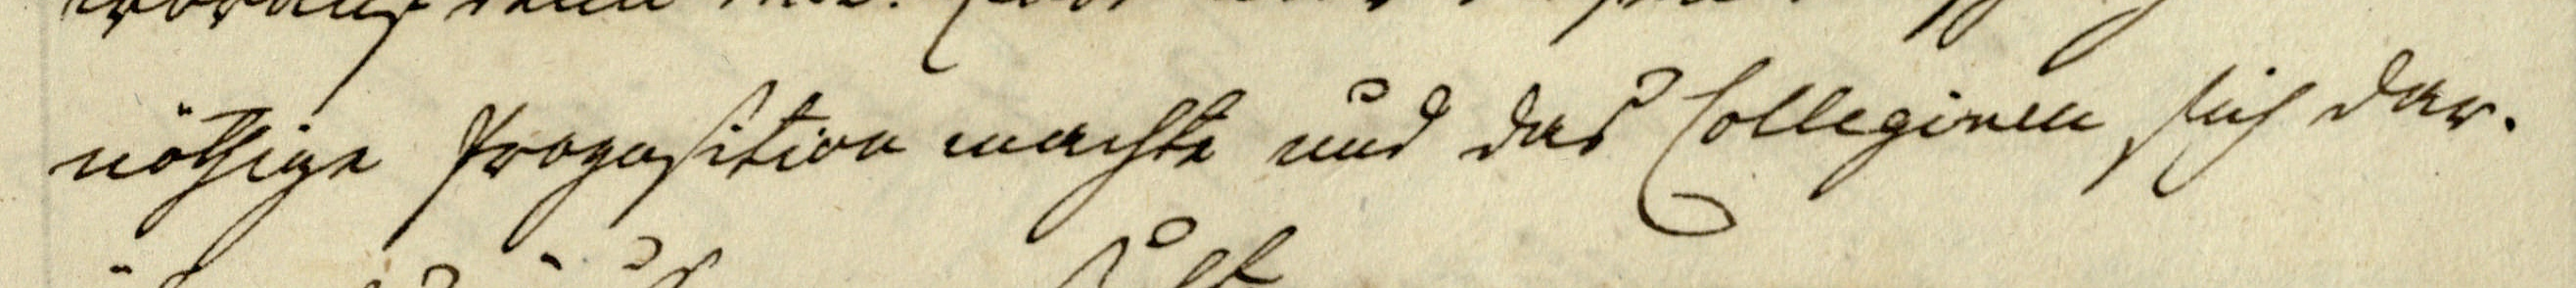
nöthige Proposition machte und das Collegium sich dar¬
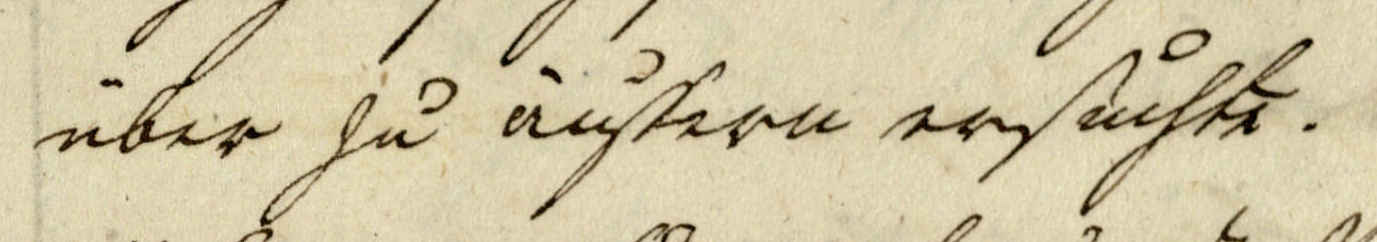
über zu äussern ersuchte.
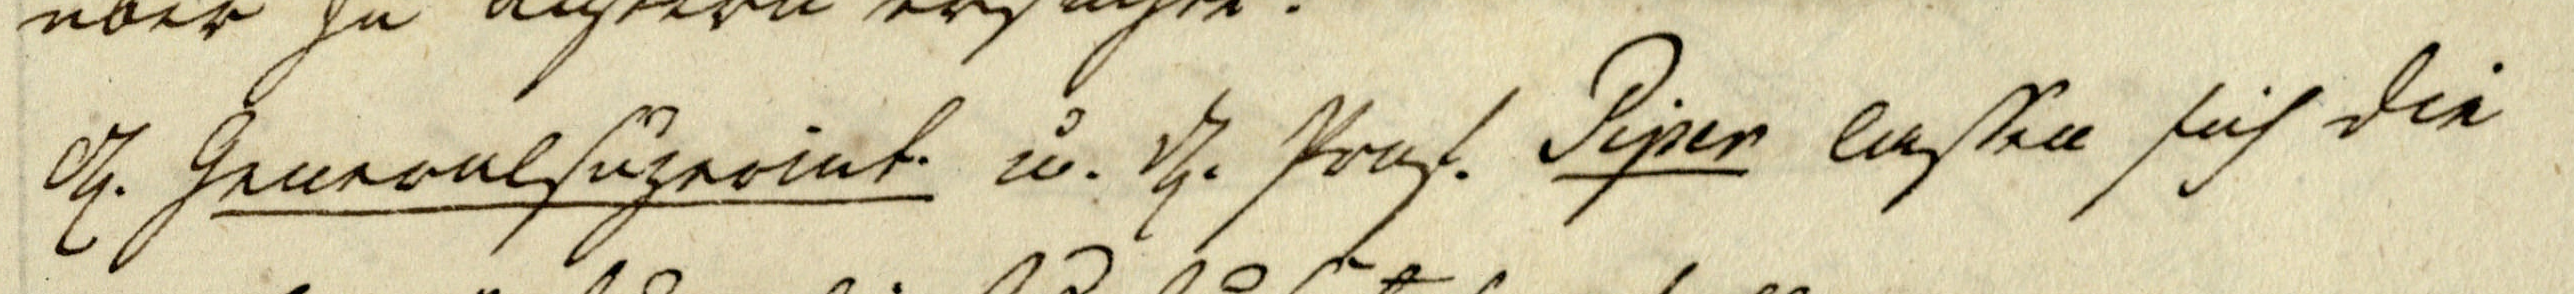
dh. Generalsuperint u. dh. Prof. Piper lassen sich die
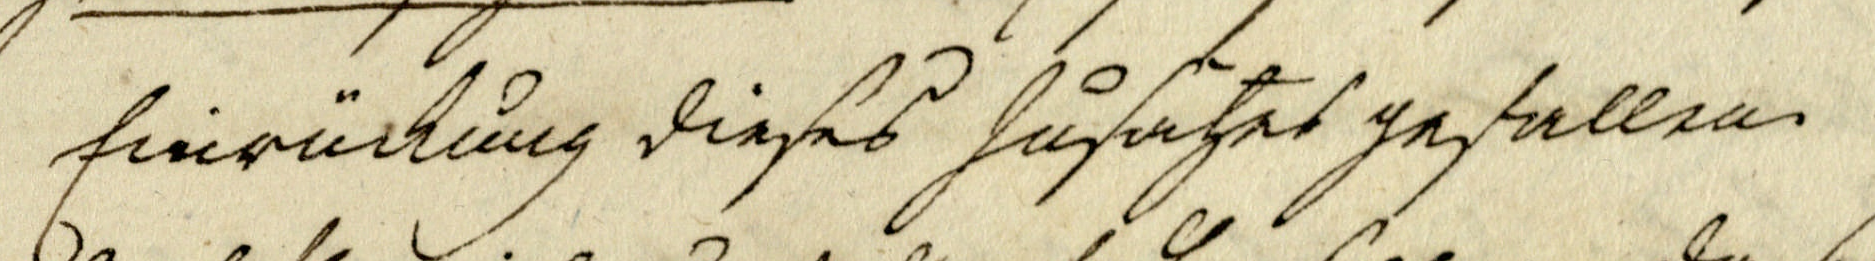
Einrückung dieses Zusatzes gefallen.
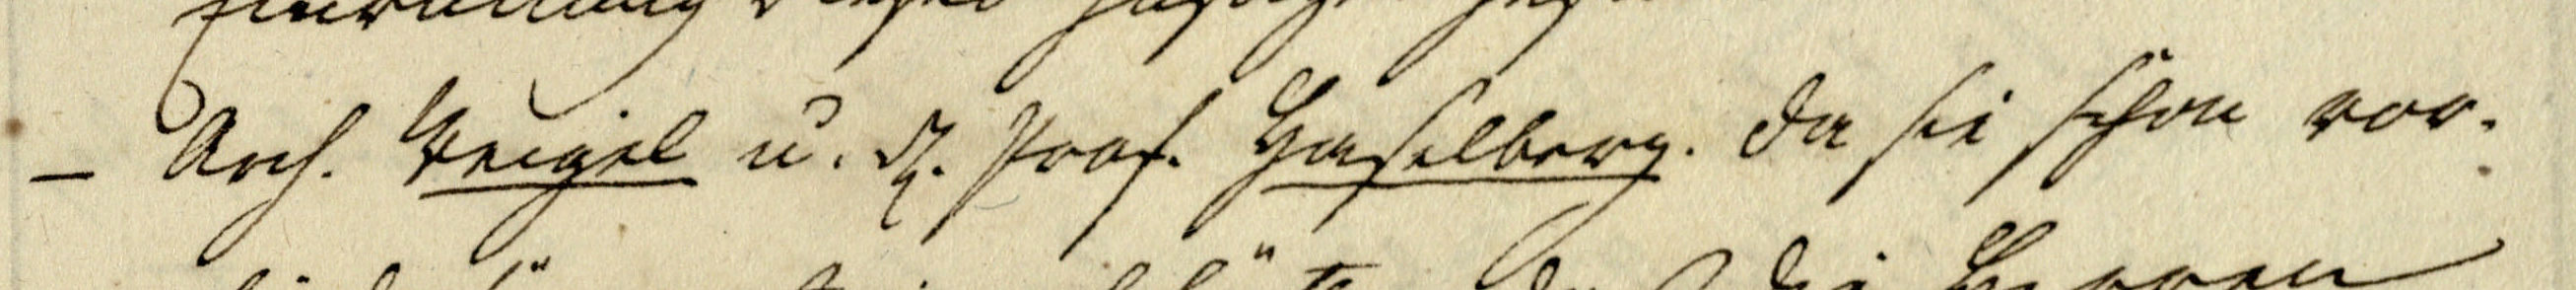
Arch. Weigel u. dh. Prof. Haselberg. da sie schon vor¬
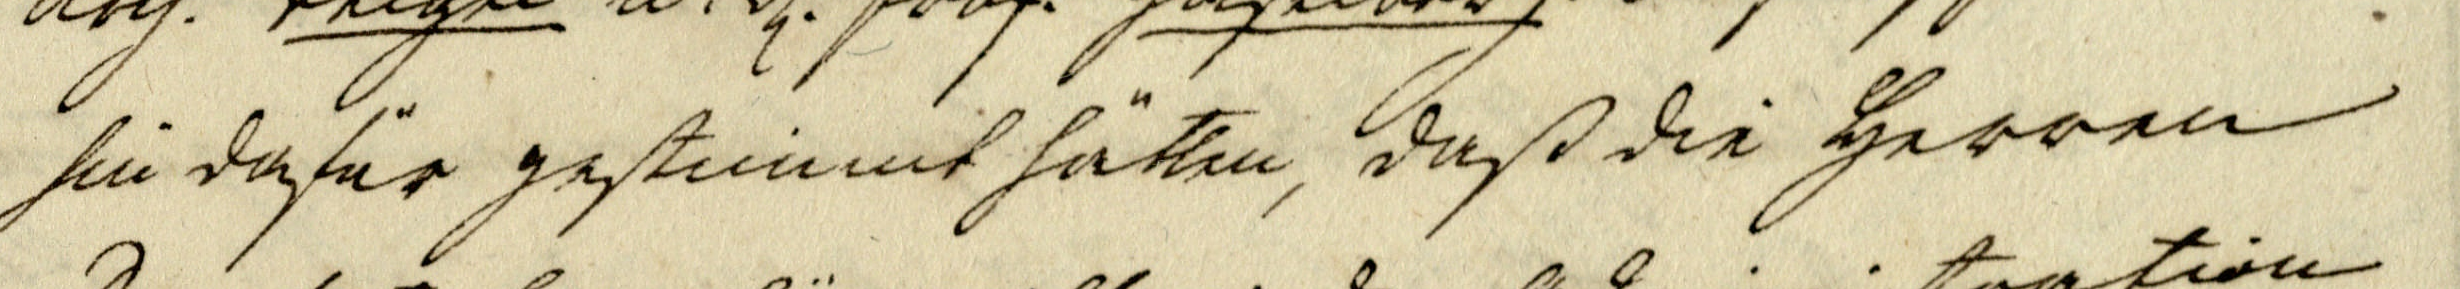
hin dafür gestimmt hätten, daß die Herren
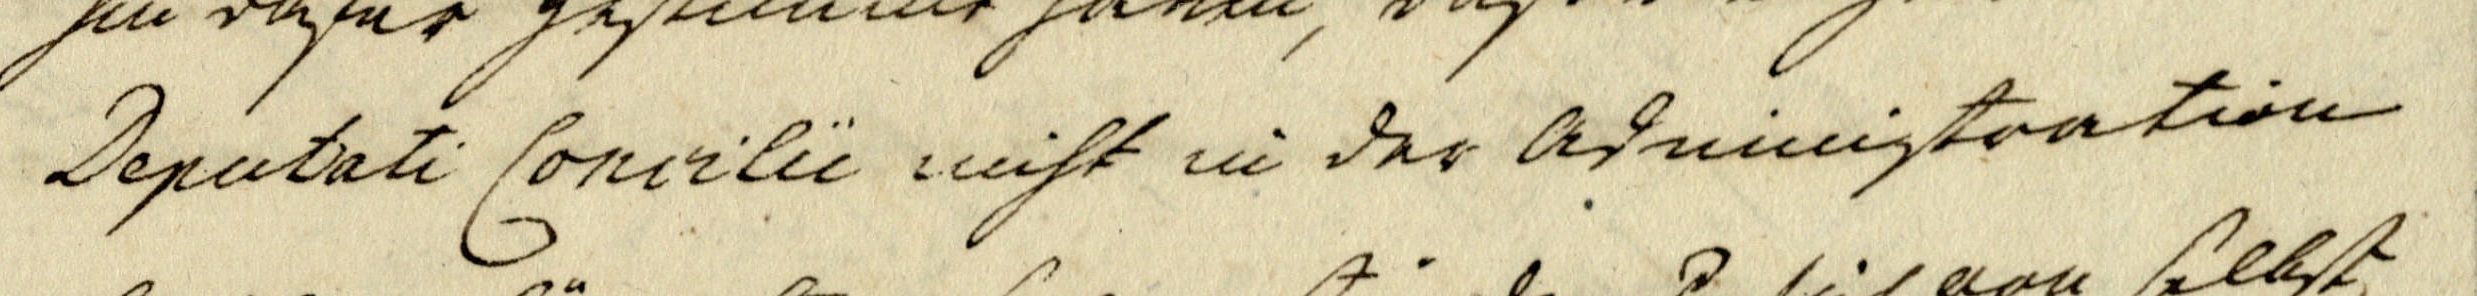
Deputati Concilii nicht in der Administration
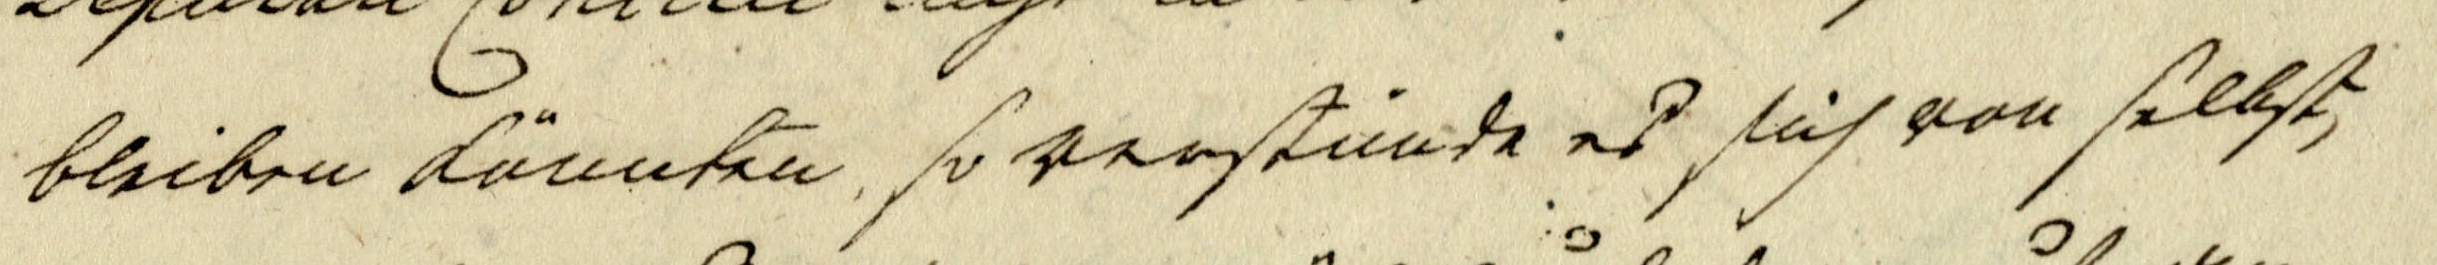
bleiben könnten, so verstünde es sich von selbst,
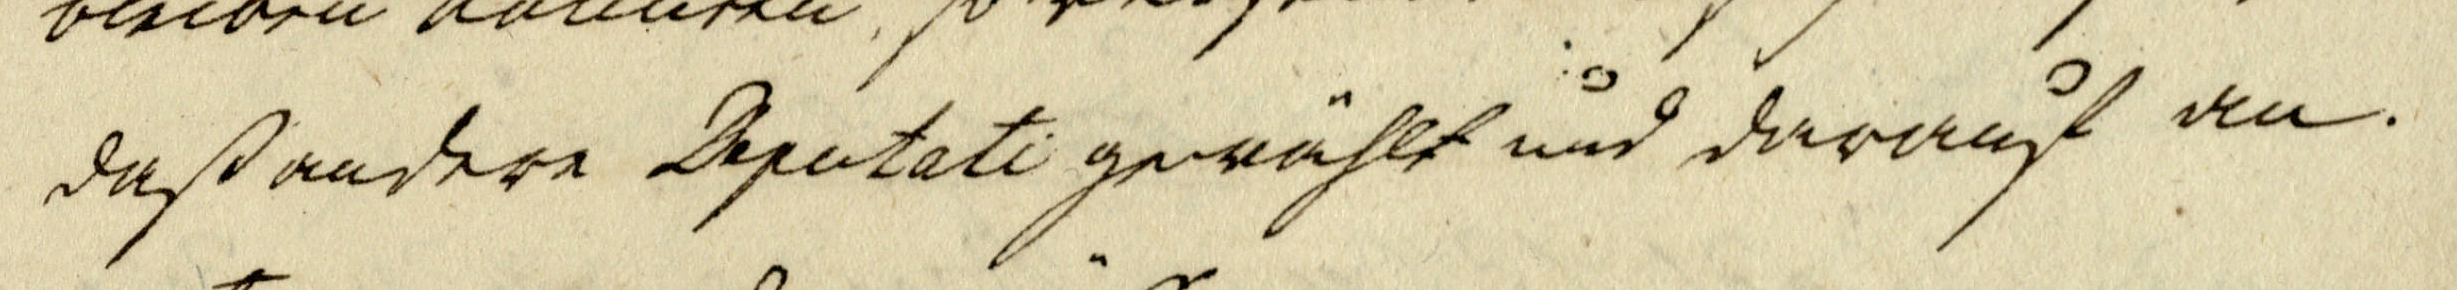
daß andere Deputati gewählt und darauf an¬
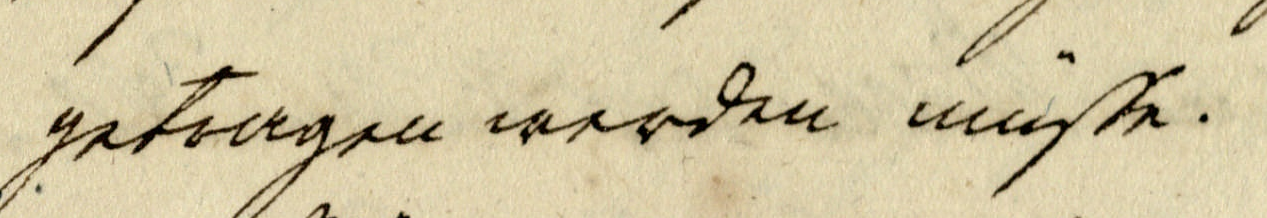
getragen werden müsse.
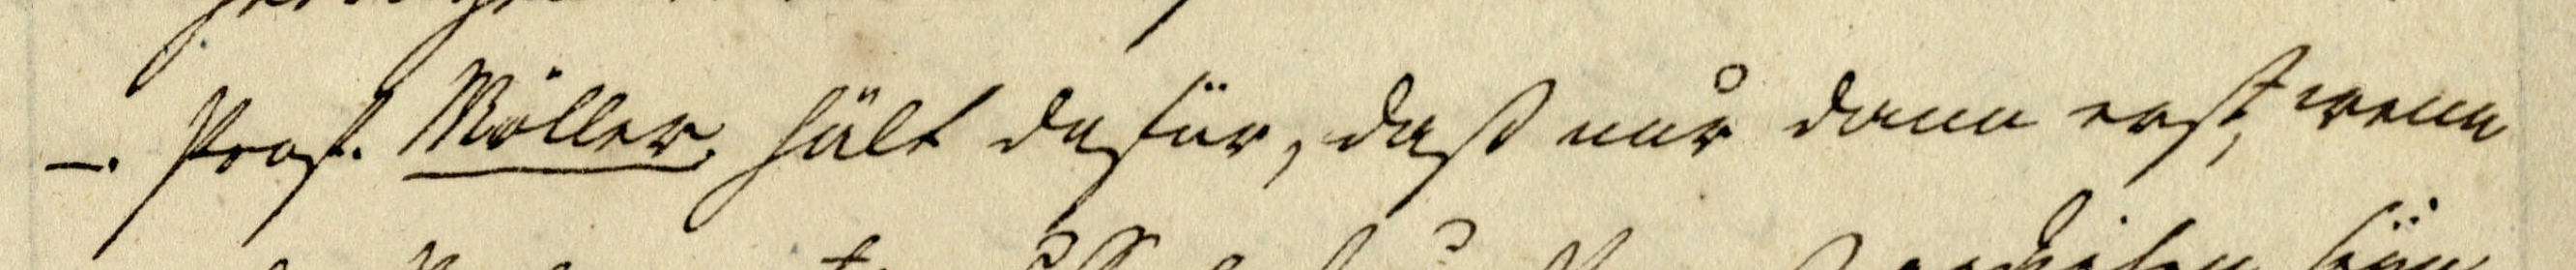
Prof. Möller hält dafür, daß nur dann erst, wenn
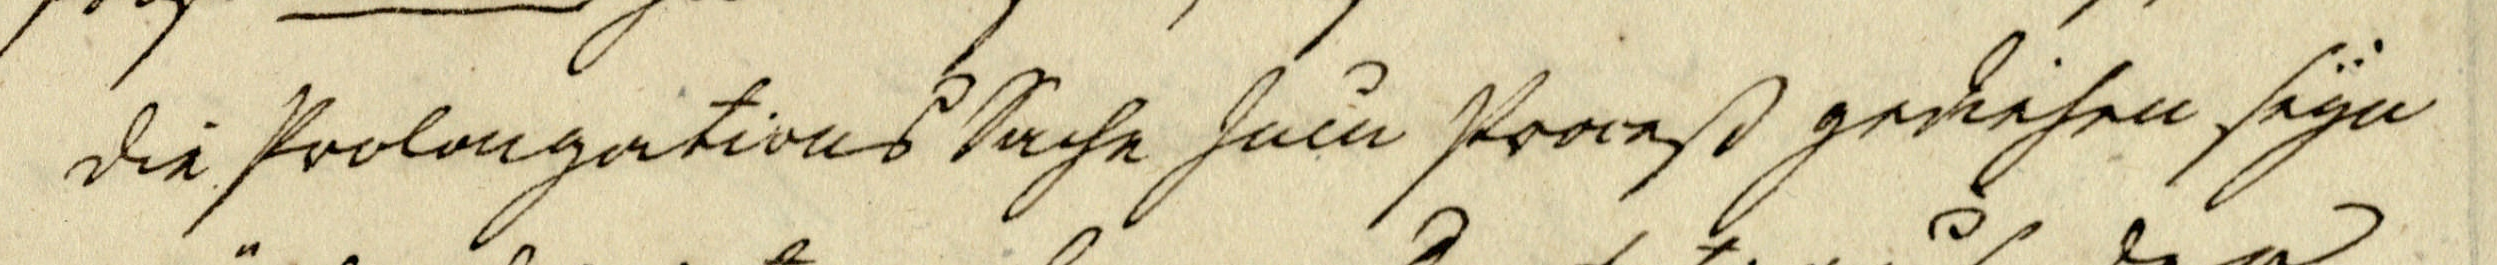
die Prolongations Sache zum Proceß gediehen seÿn
